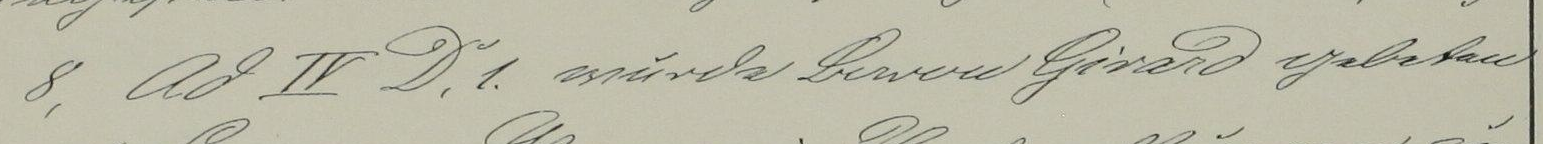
8. Ad IV D, 1. wurde Baron Girard gebeten
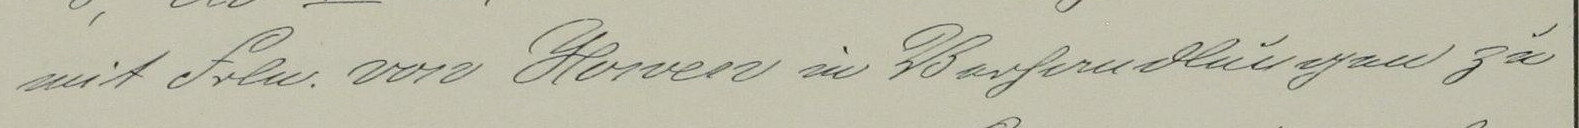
mit Frln. von Howen in Verhandlungen zu
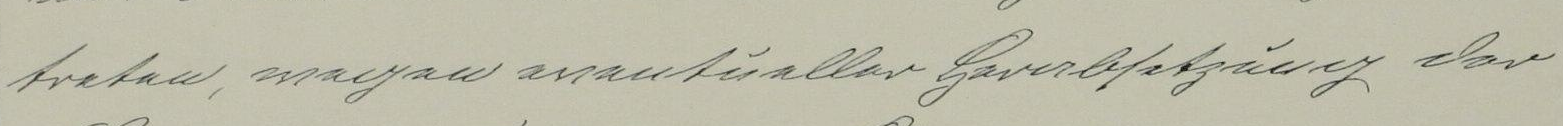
treten, wegen eventueller Herabsetzung der
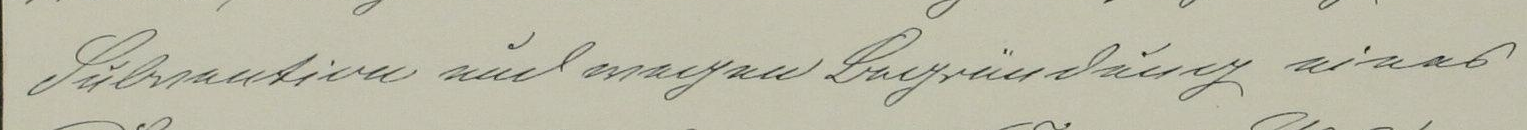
Subvention und wegen Begründung eines
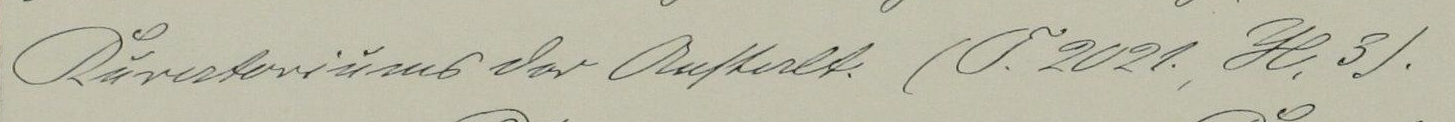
Kuratoriums der Anstalt. (T.2021; H.3).
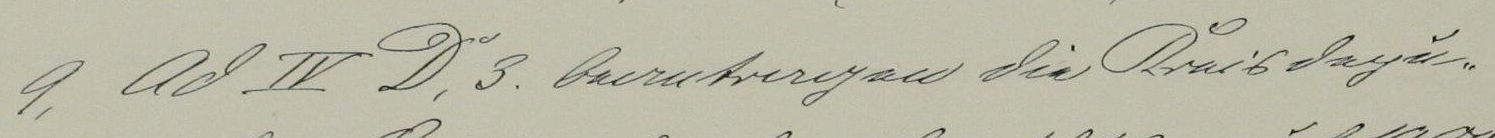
9. Ad IV D, 3. beantragen die Kreisdepu-
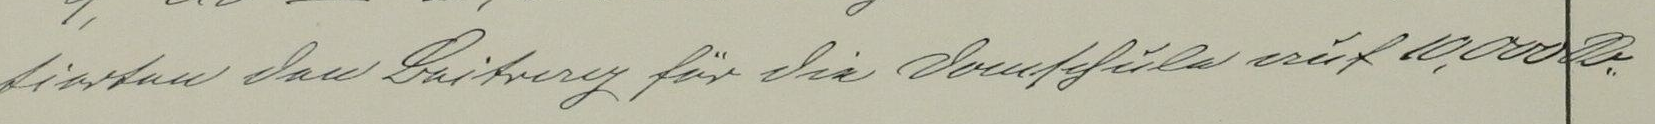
tierten, den Beitrag für die Domschule auf 10.000 Ro.
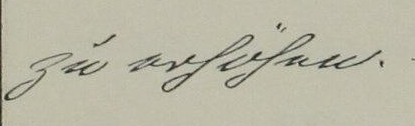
zu erhöhen.
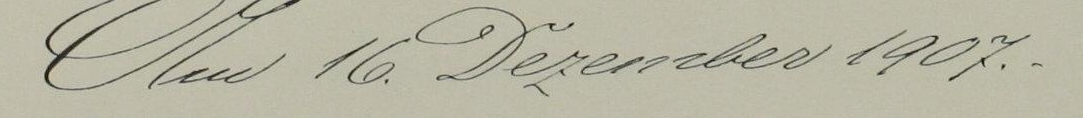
Am 16. Dezember 1907. -
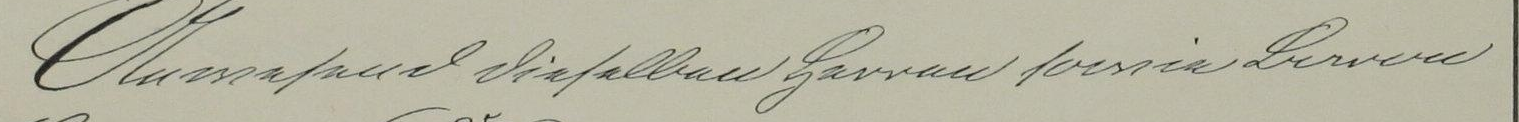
Anwesend dieselben Herren sowie Baron
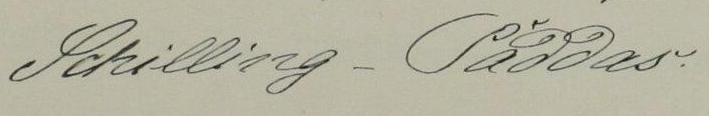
Schilling-Paddas.
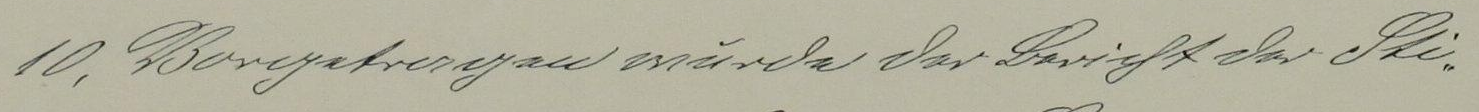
10. Vorgetragen wurde der Bericht der Sti-
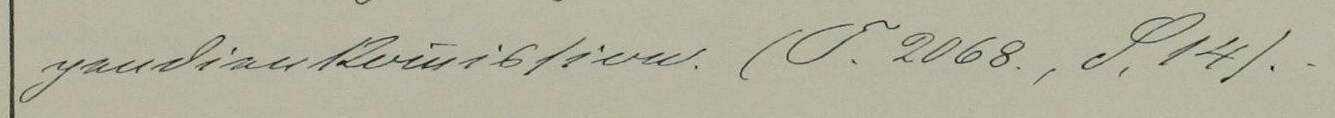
pendienkommission. (T.2068; S.14).
